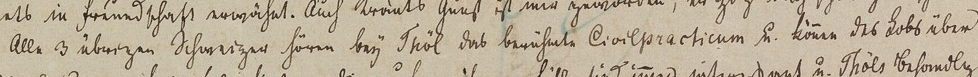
Alle 3 übrigen Schweizer hören bey Thöl das berühmte Civilpracticum u. können des Lobs über
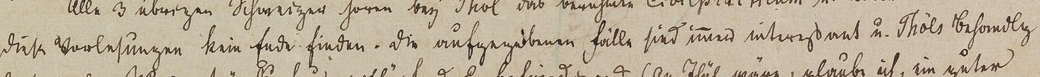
diese Verlesungen kein Ende finden. Die aufgegebenen Fälle sind immer interessant u. Thöls Behandlg
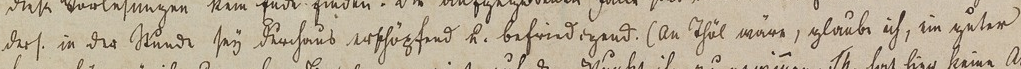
ders. in der Stunde sey durchaus erschöpfend u. befriedigend. (An Thöl wäre, glaube ich, ein guter
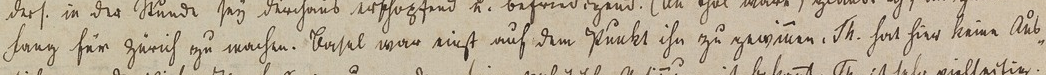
Fang für Zürich zu machen. Basel war einst auf dem Punkt ihn zu gewinnen. Th. hat hier keine Aus-
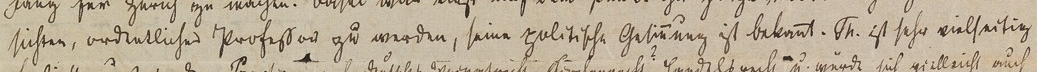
sichten, ordentlicher Professor zu werden, seine politische Gesinnung ist bekannt. Th. ist sehr vielseitig.
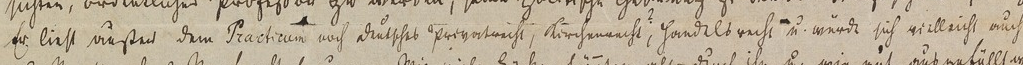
Er liest außer dem Practicum noch Deutsches Privatrecht, Kirchenrecht, Handelsrecht u. würde sich vielleicht auch
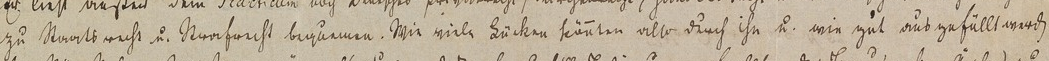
zu Staatsrecht u. Strafrecht bequemen. Wie viele Lücken könnten also durch ihn u. wie gut ausgefüllt werden.
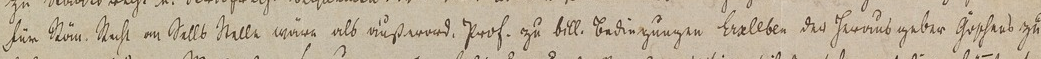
Für Röm. Recht an Sells Stelle wäre als außerord. Prof. zu bill. Bedingungen Erxleben der Herausgeber Göschens zu
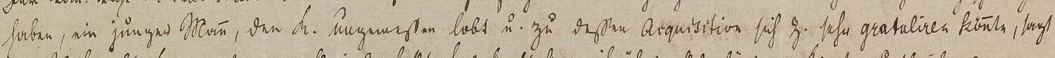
haben, ein junger Mann, den R. ungemessen lobt u. zu dessen Acquisition sich Z. sehr gratuliren könnte, sagt
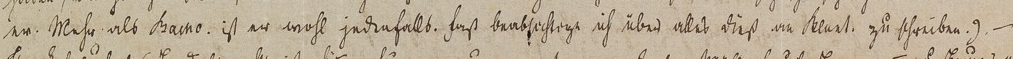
er. Mehr als Bacho. ist er wohl jedenfalls. Fast beabsichtige ich über alles Dieß an Blunt. zu schreiben.). –
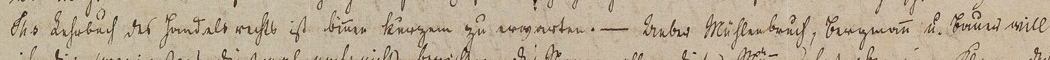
Ths Lehrbuch des Handelsrechts ist binnen kurzem zu erwarten. – Ueber Mühlenbruch, Bergmann u. Bauer will
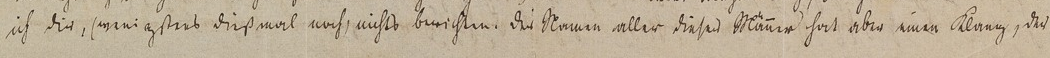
ich dir, (wenigstens dießmal noch) nichts berichten. Der Namen aller dieser Männer hat aber einen Klang, der
